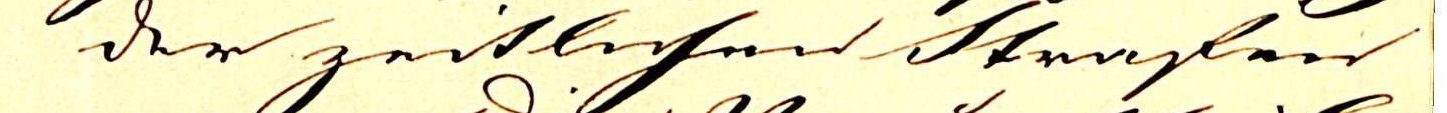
der zeitlichen Strafen
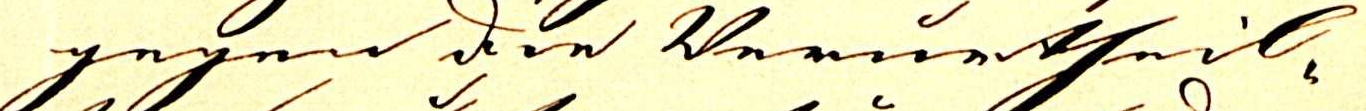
gegen die Verurtheil¬
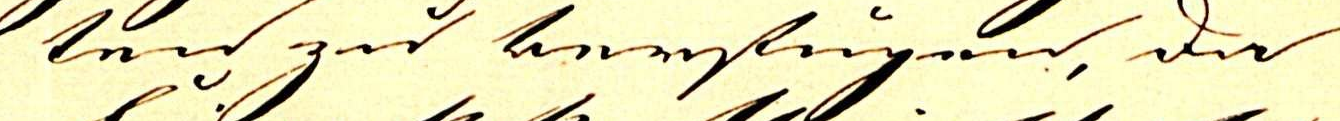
ten zu verfügen, da
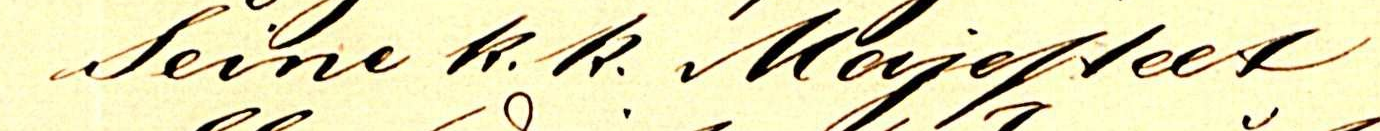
seine k. k. Majestat
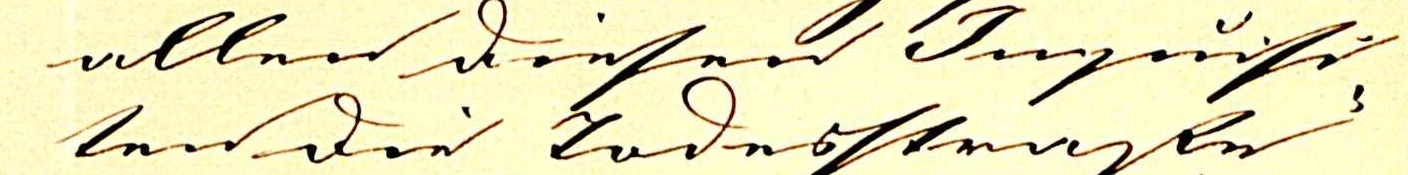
allen diesen Inquisi¬
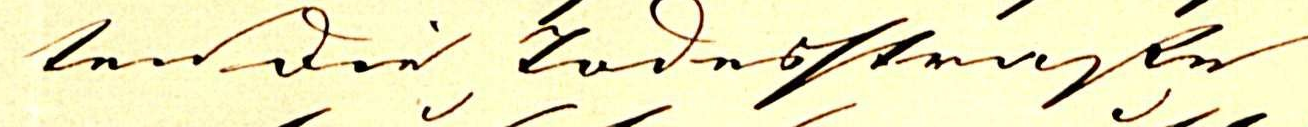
ten die Todesstrafe
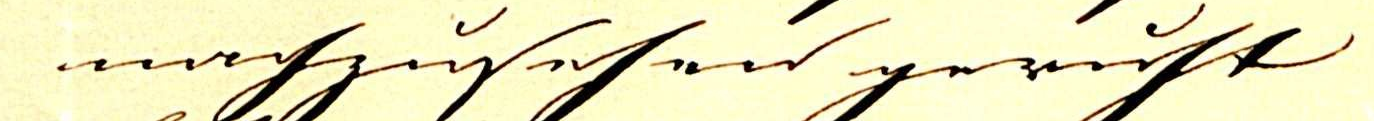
nachzusehen geruht
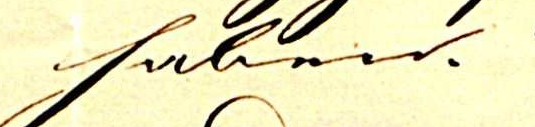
haben.
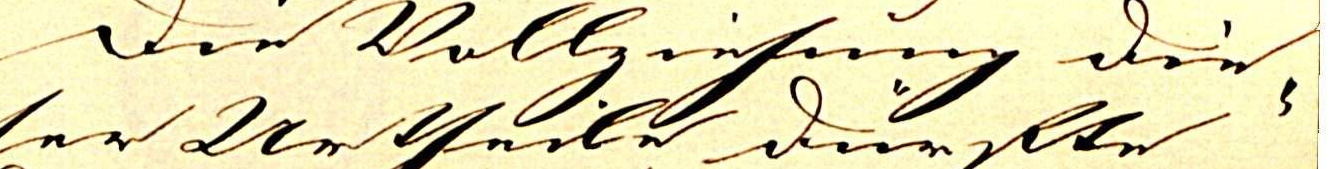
Die Vollziehung die¬
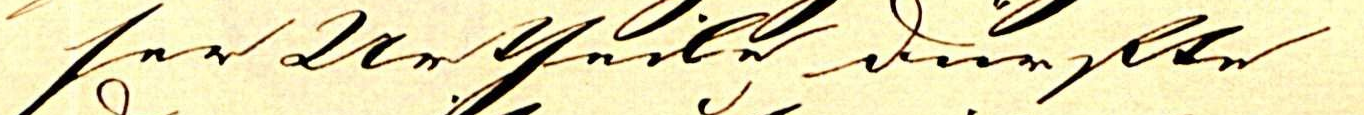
ser Urtheile dürfte
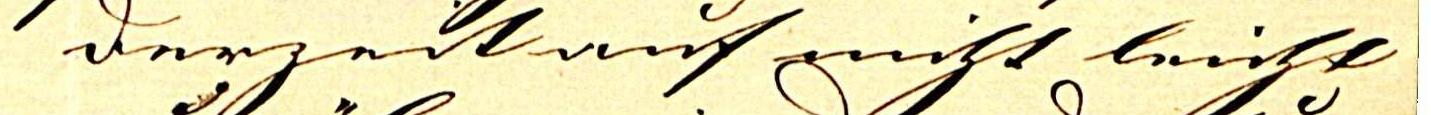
derzeit auf nicht leicht
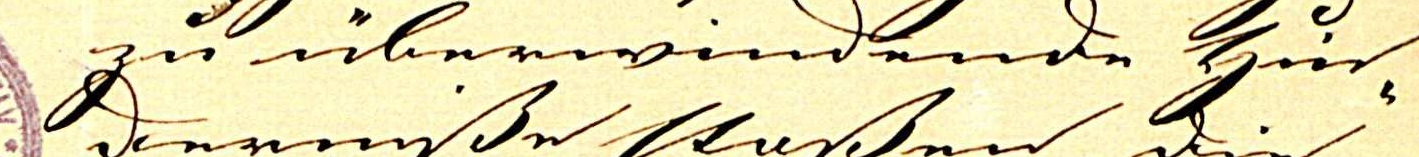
zu überwindende Hin¬
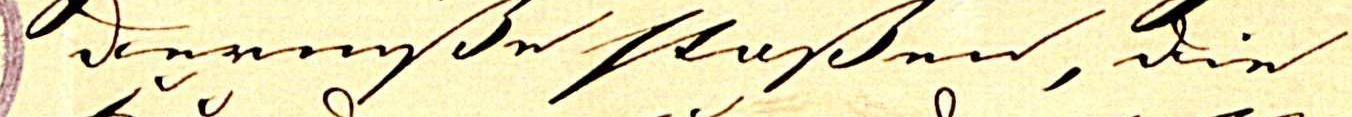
derniße stoßen, die
